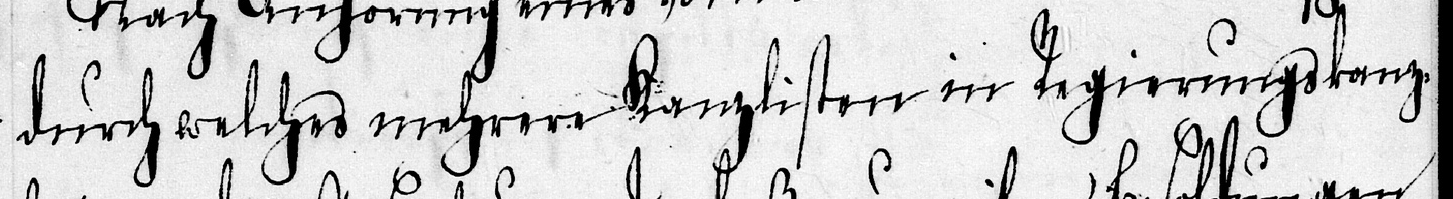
durch welches mehrere Kanzlisten in Regierungskanz¬
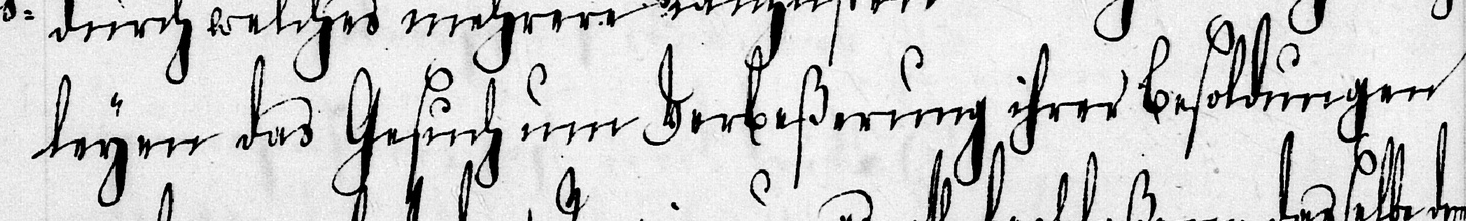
leyen das Gesuch um Verbeßerung ihrer Besoldungen
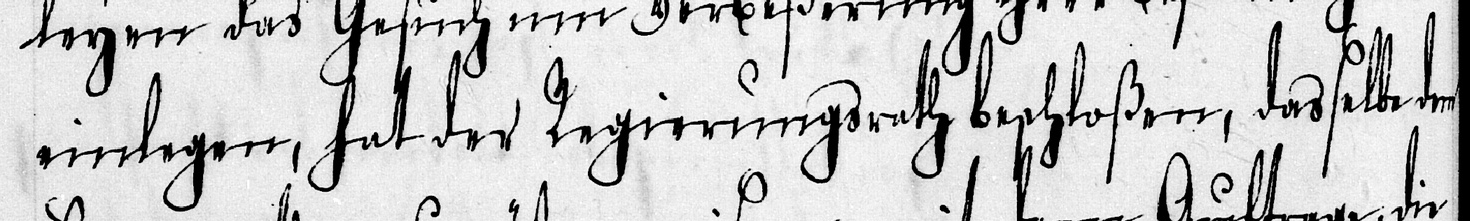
einlegen, hat der Regierungsrath beschloßen, dasselbe
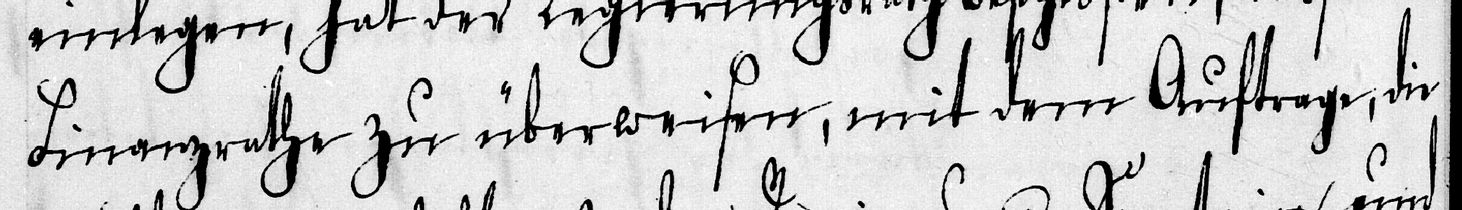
Finanzrathe zu überweisen, mit dem Auftrage, die
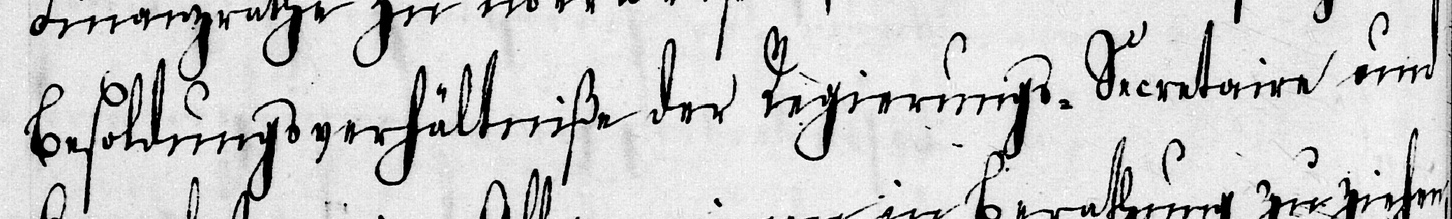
Besoldungsverhältniße der Regierungs-Secretaire und
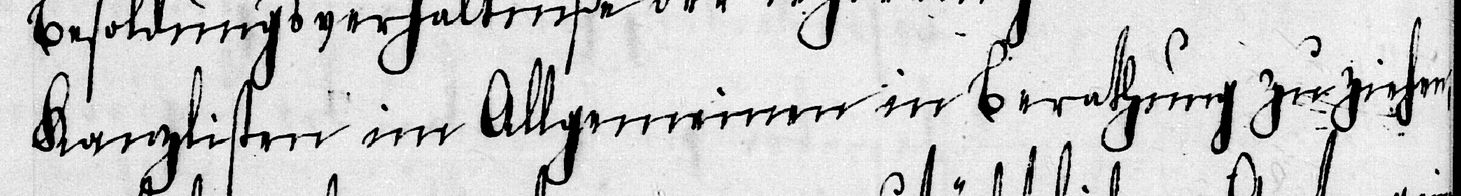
Kanzlisten im Allgemeinen in Berathung zu ziehen,
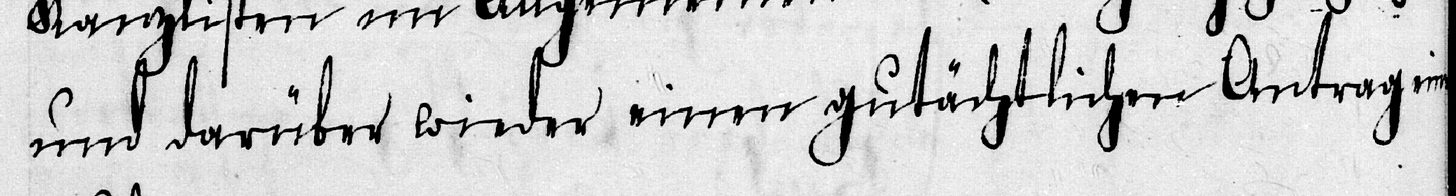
und darüber wieder einen gutächtlichen Antrag
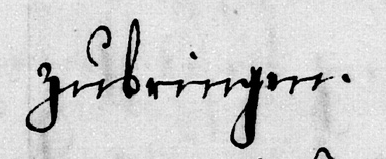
zubringen.
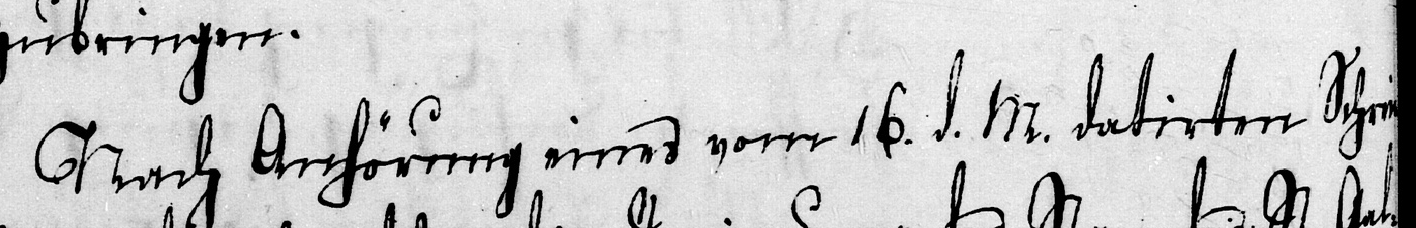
Nach Anhörung eines vom 16. d. M. datirten Schr¬
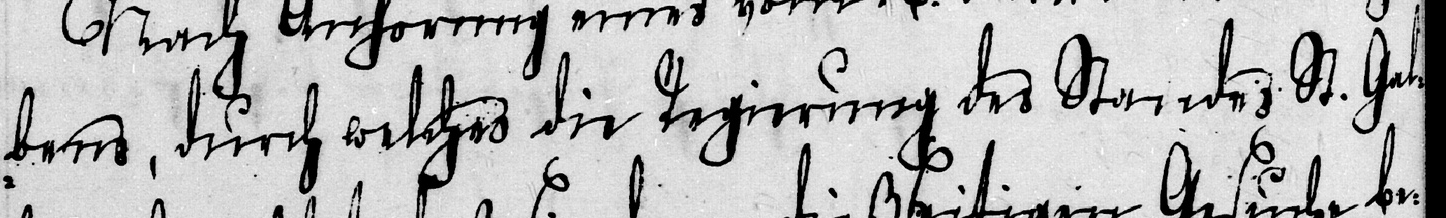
bens, durch welches die Regierung des Standes St. Gal¬
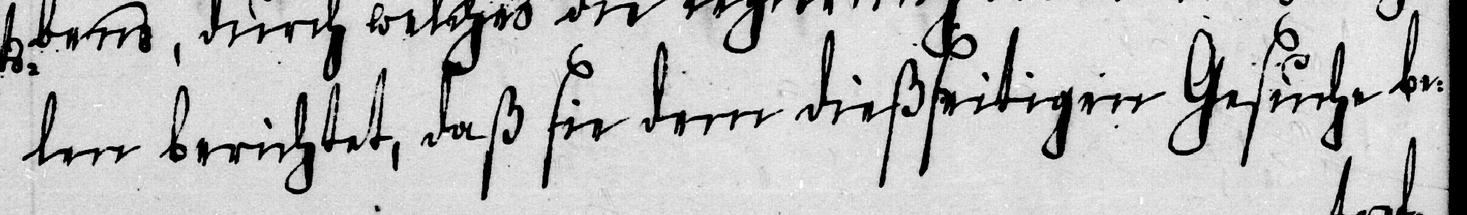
len berichtet, daß sie dem dießseitigen Gesuche be-
